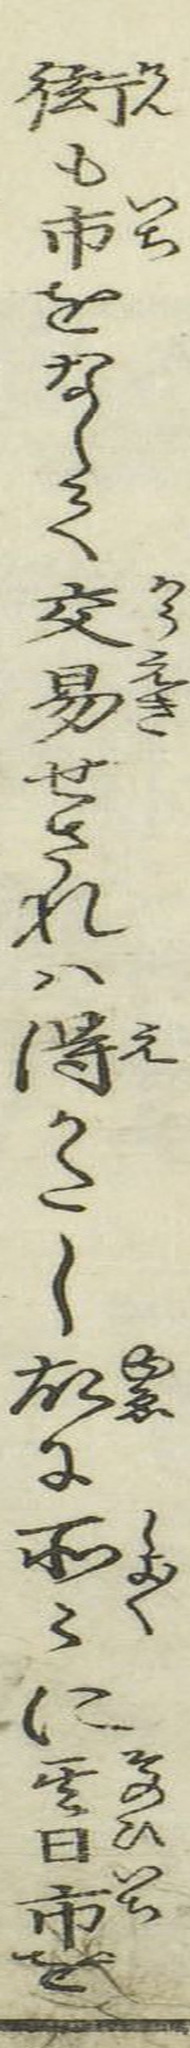衒も市をなして交易せされは得かたし故に所々に其日市を
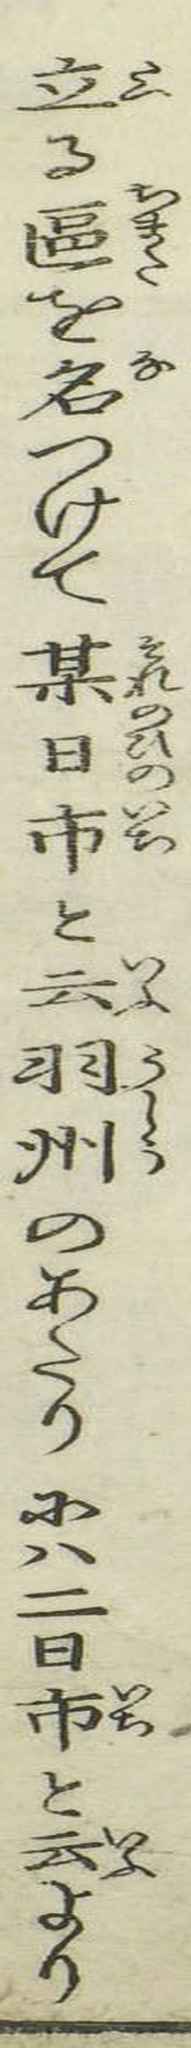立る區を名つけて某日市と云羽州のあたりには二日市と云より
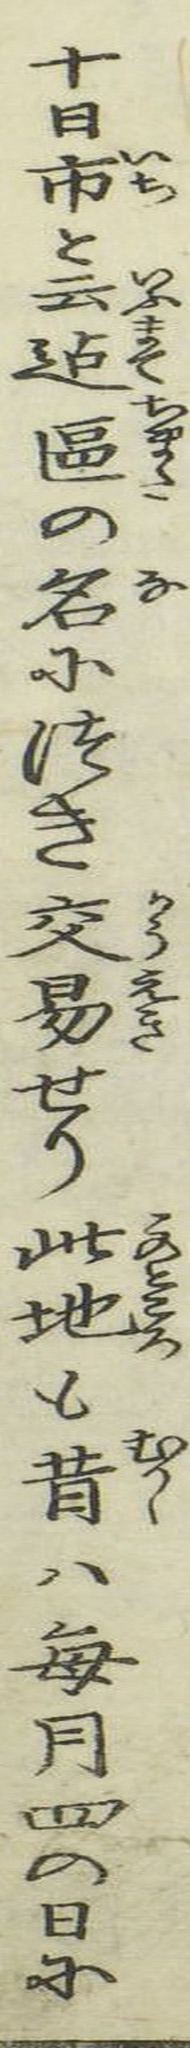十日市と云迄區の名につき交易せり此地も昔は毎月四の日に

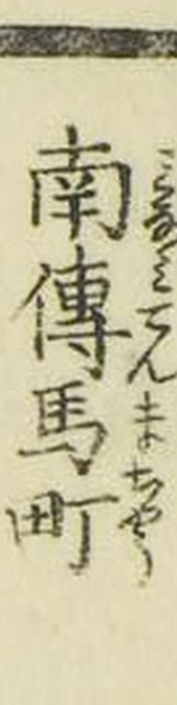南傳馬町
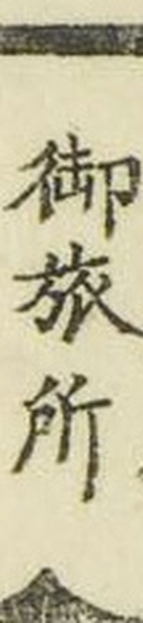御旅所
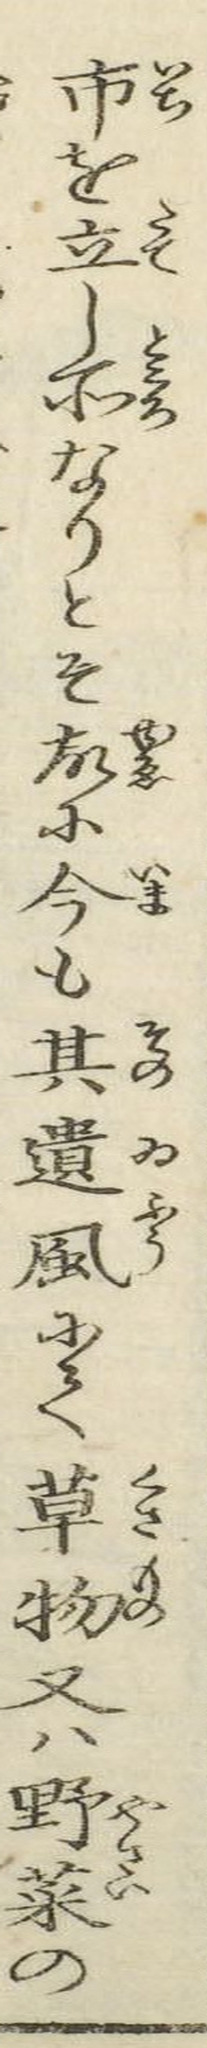市を立し所なりとそ故に今も其遺風にて草物又は野菜の
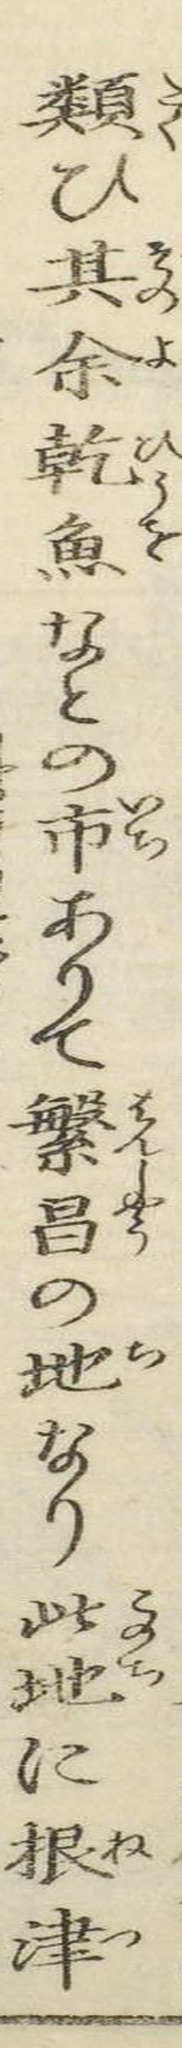類ひ其余乾魚なとの市ありて繁昌の地なり此地に根津
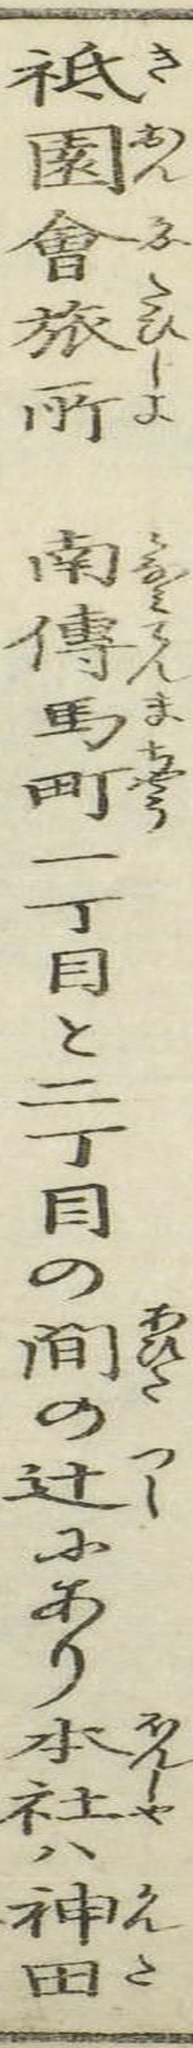祇園會旅所南傳馬町一丁目と二丁目の間の辻にあり本社は神田
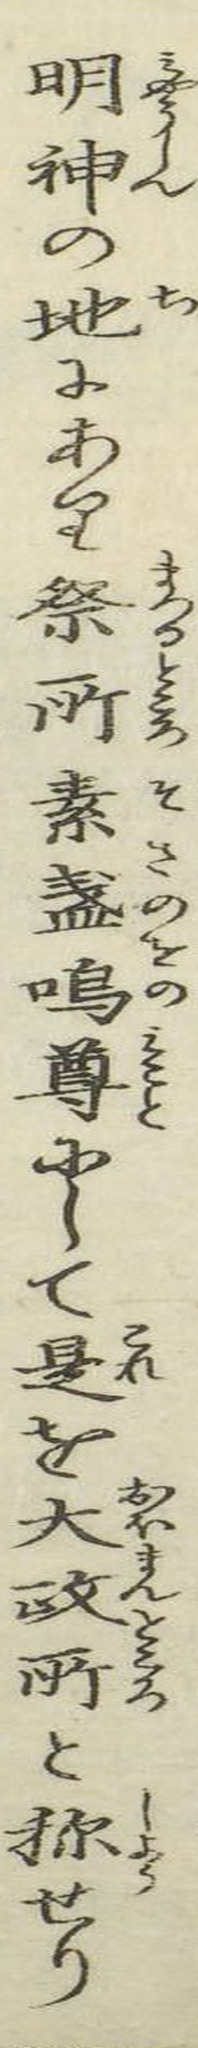明神の地にあり祭所素盞嗚尊にして是を大政所と称せり
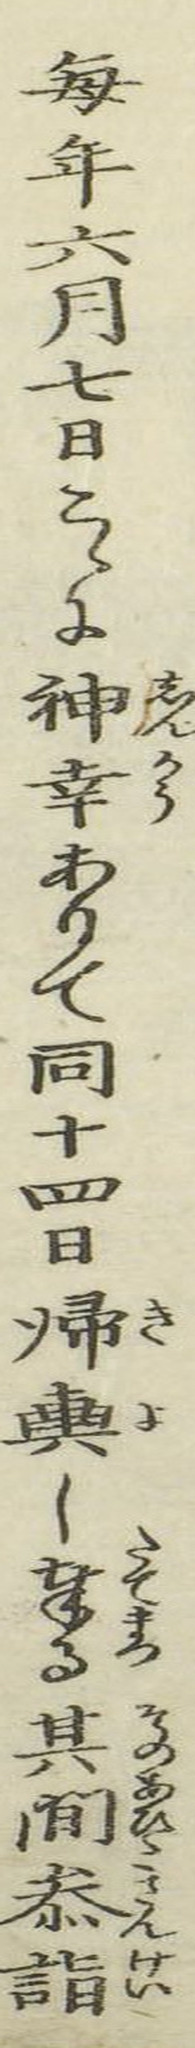毎年六月七日こゝに神幸ありて同十四日帰輿し奉る其間参詣
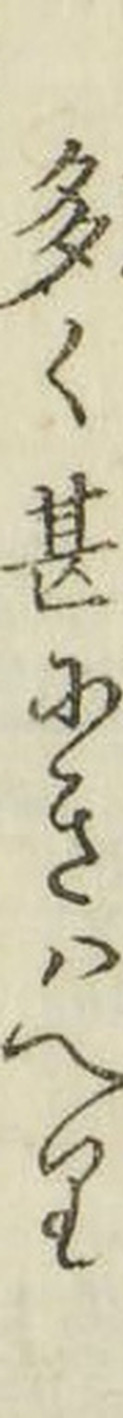多く甚にきはへり
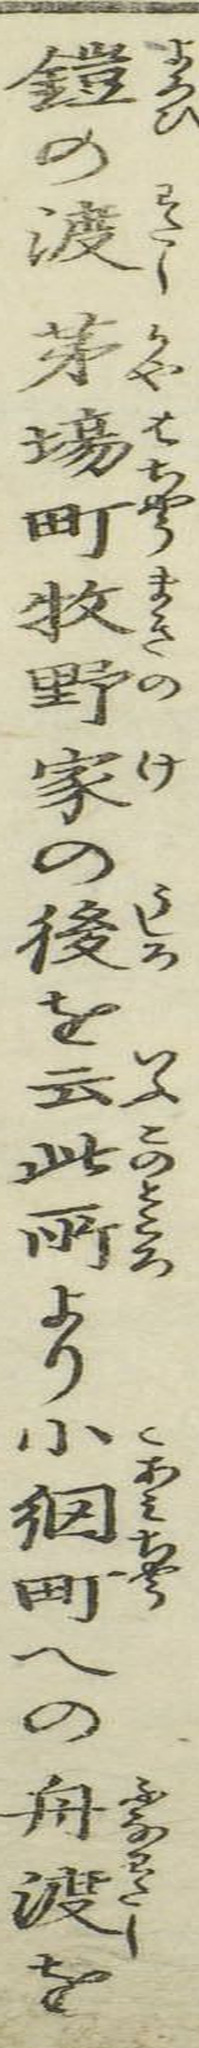鎧の渡茅場町牧野家の後を云此所より小網町への舟渡を
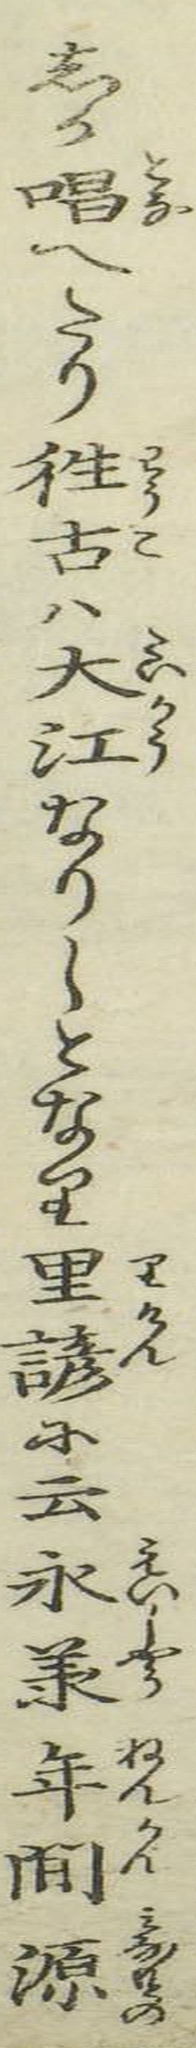しか唱へたり往古は大江なりしとなり里諺に云永承年間源
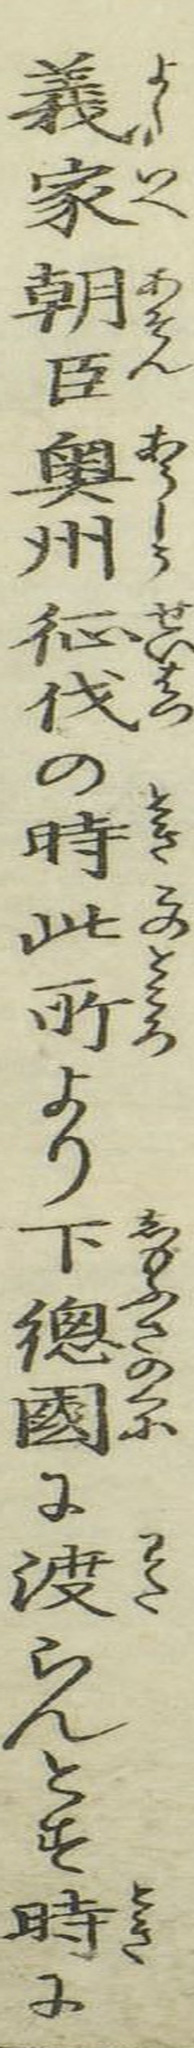義家朝臣奥州征伐の時此所より下総國に渡らんとす時に

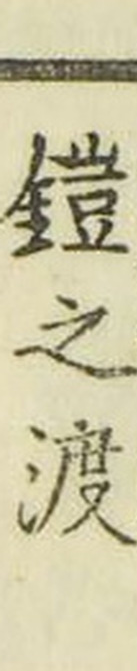鎧之渡

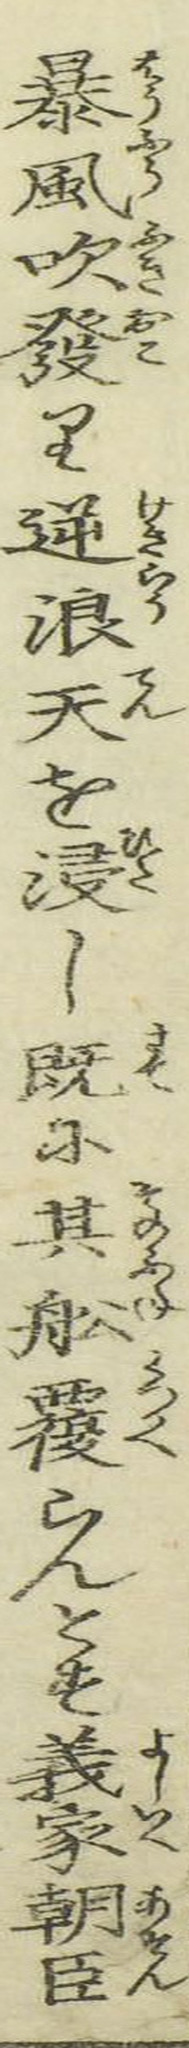暴風吹發り逆浪天を浸し既に其舩覆らんとす義家朝臣
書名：江戸名所図会 20巻 巻之2
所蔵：東京学芸大学教育コンテンツアーカイブ
